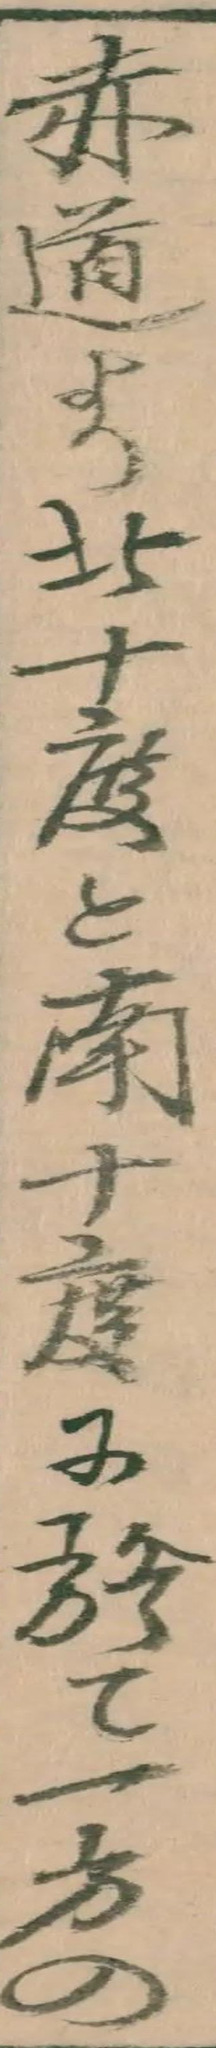赤道より北十度と南十度に於て一方の
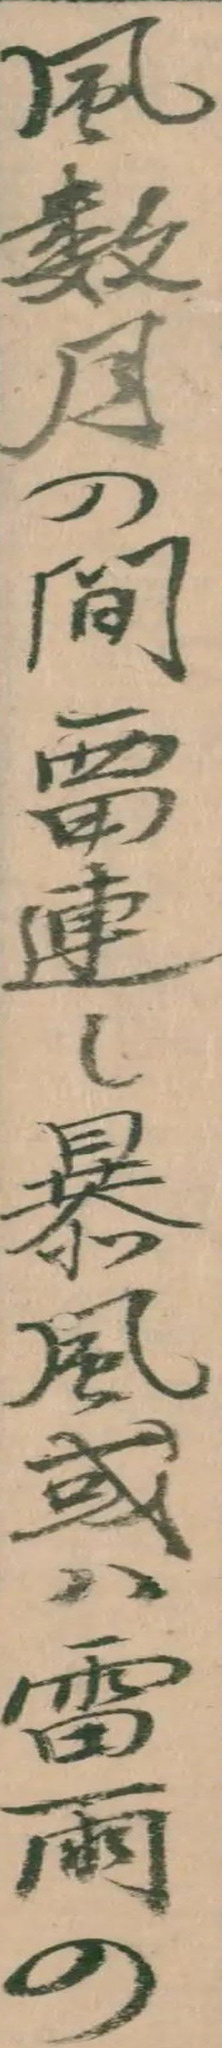風数月の間留連し暴風或ハ雷雨の
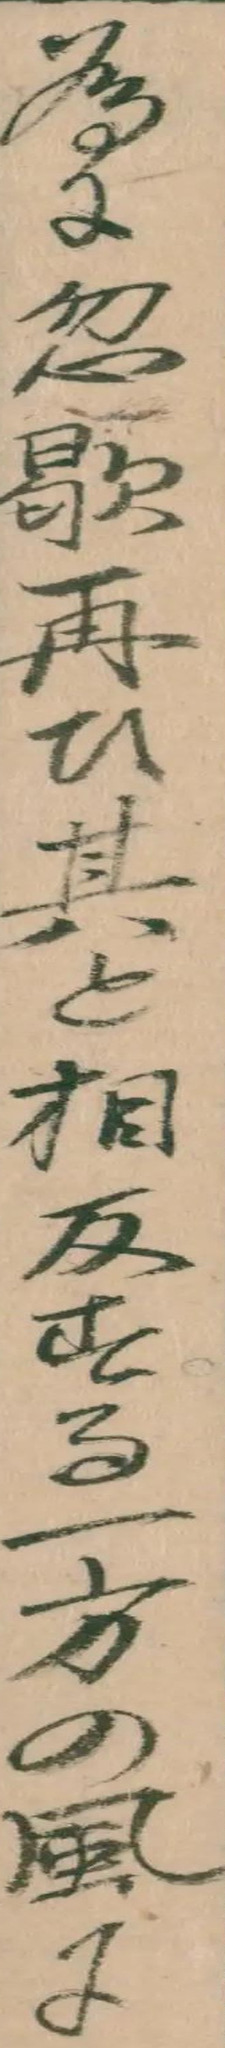為に忽歇再ひ其と相反する一方の風に
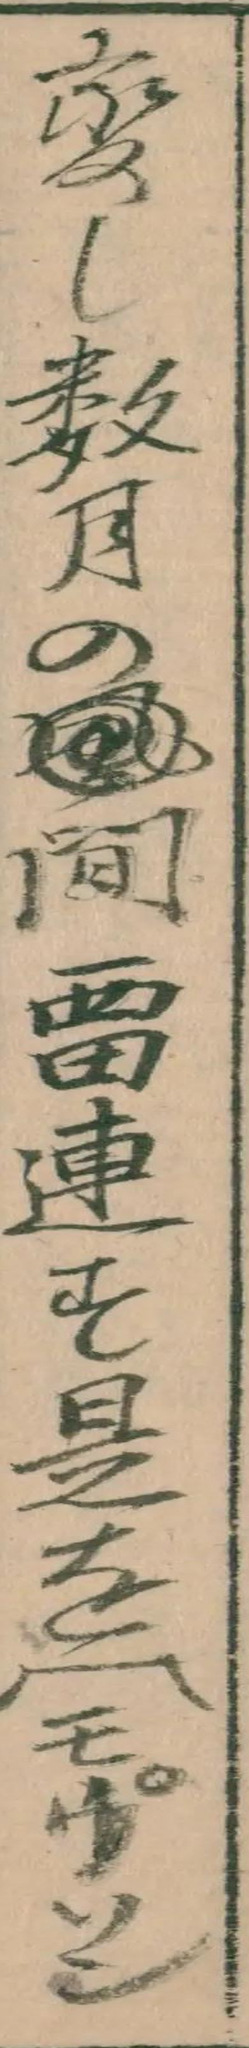変し数月の間留連す是を(モウソン
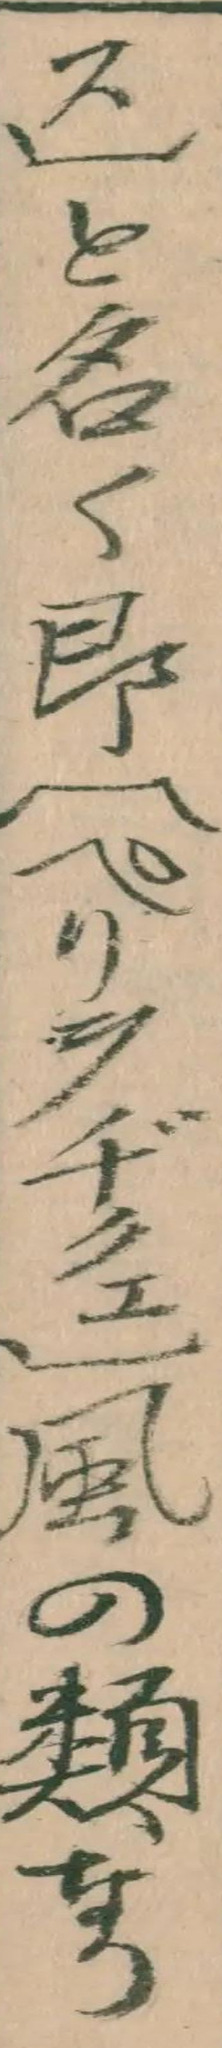ス)と名く即(ペリヲヂクェ)風の類なり
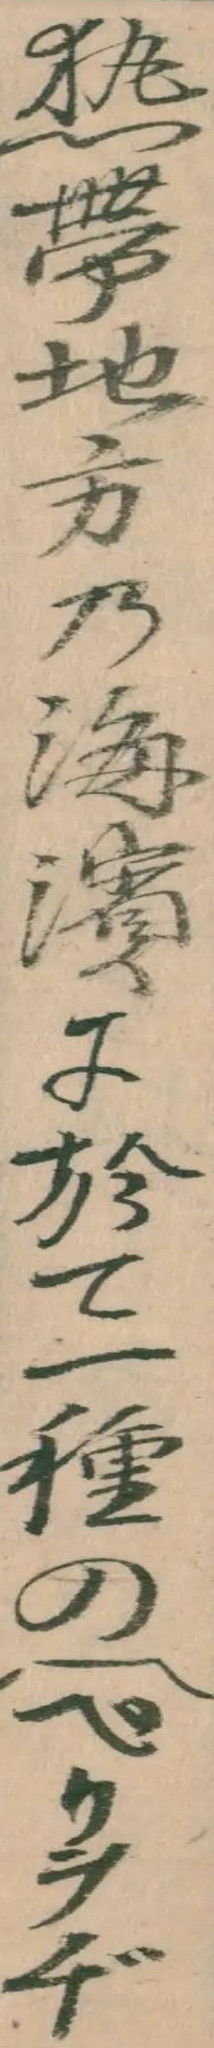熱帯地方の海浜に於て一種の(ペリヲヂ
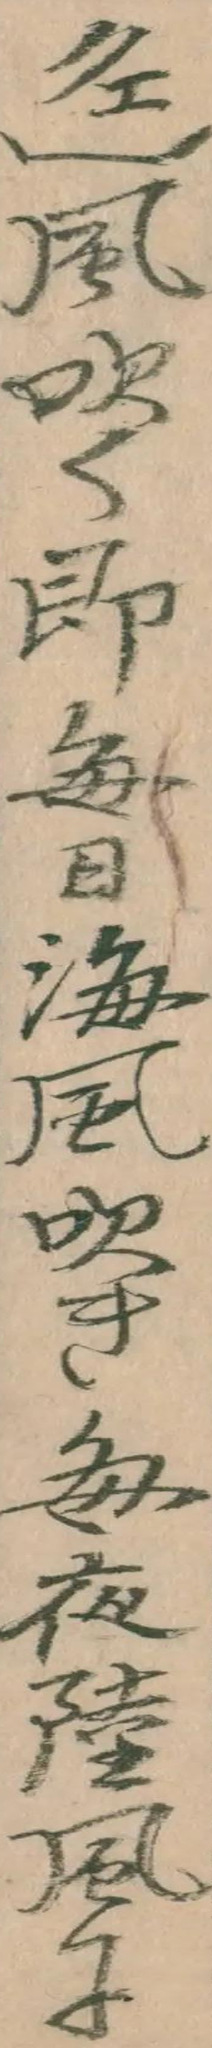クェ)風吹く即毎日海風吹き毎夜陸風に
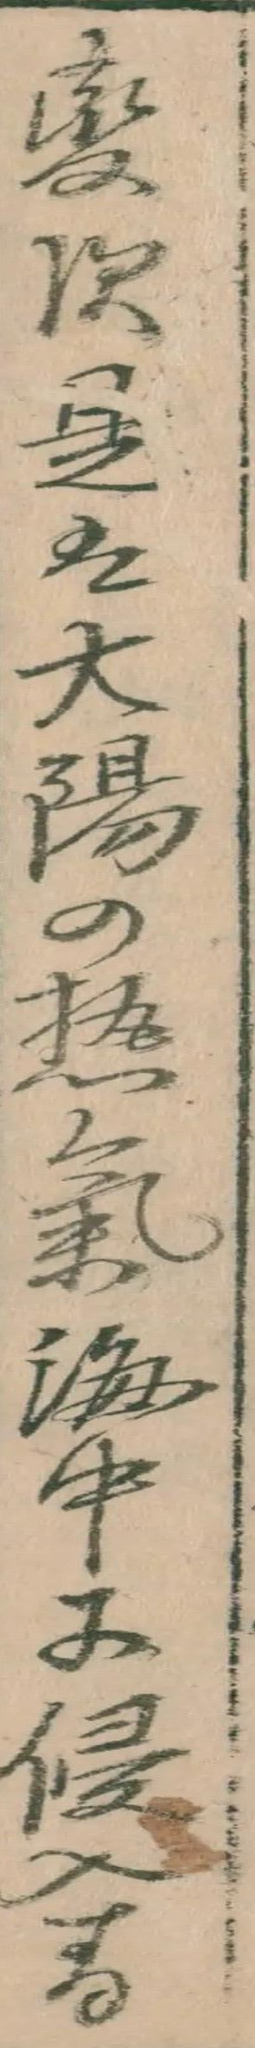変す是を大陽の熱気海中に侵入する
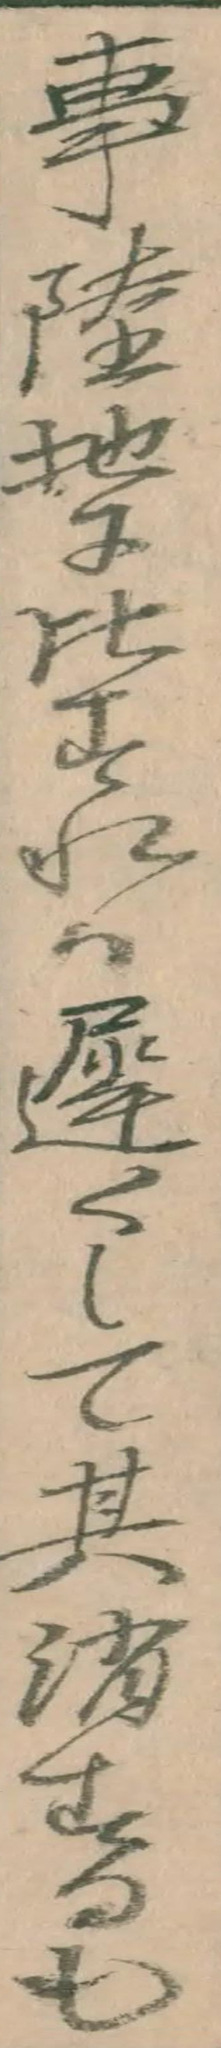事陸地に比すれは遅くして其消するも

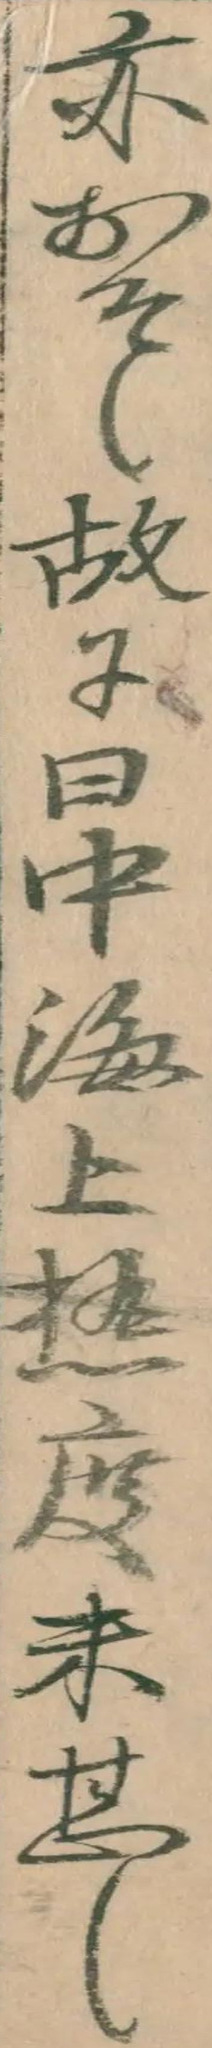亦おそし故に日中海上熱度未甚し
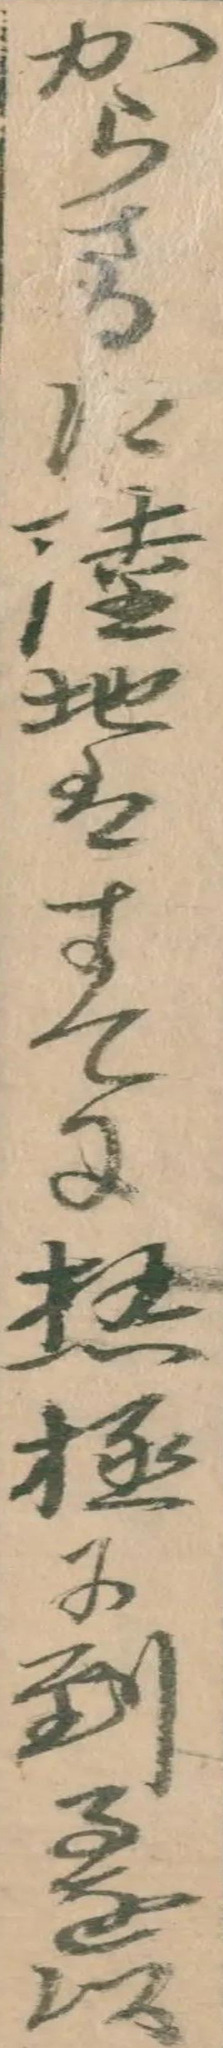からさるに陸地はすてに熱極に到るを以
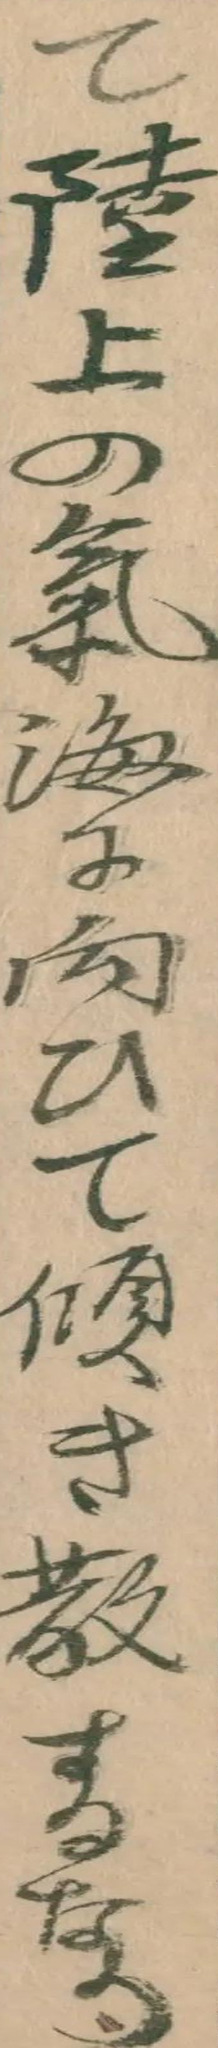て陸上の気海に向ひて傾き散するなり
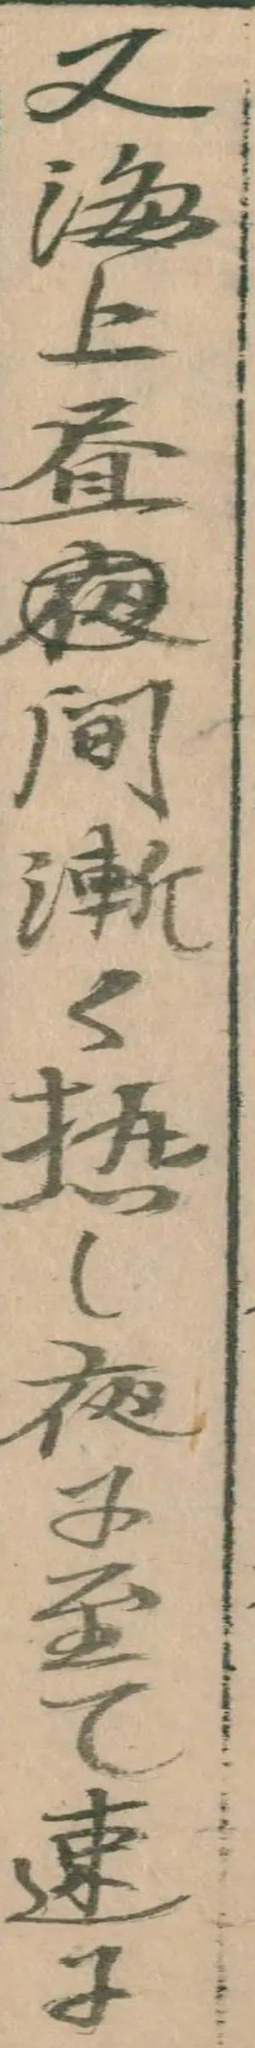又海上昼間漸く熱し夜に至て速に
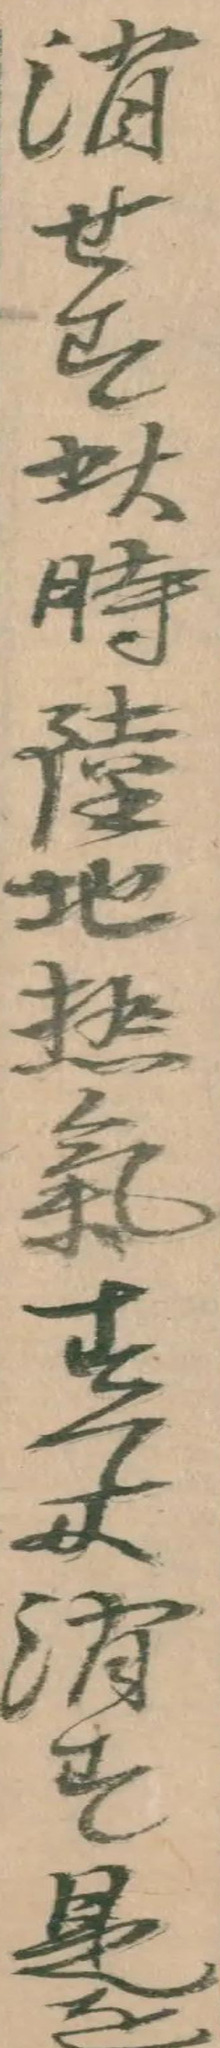消せす此時陸地熱気すてに消す是を
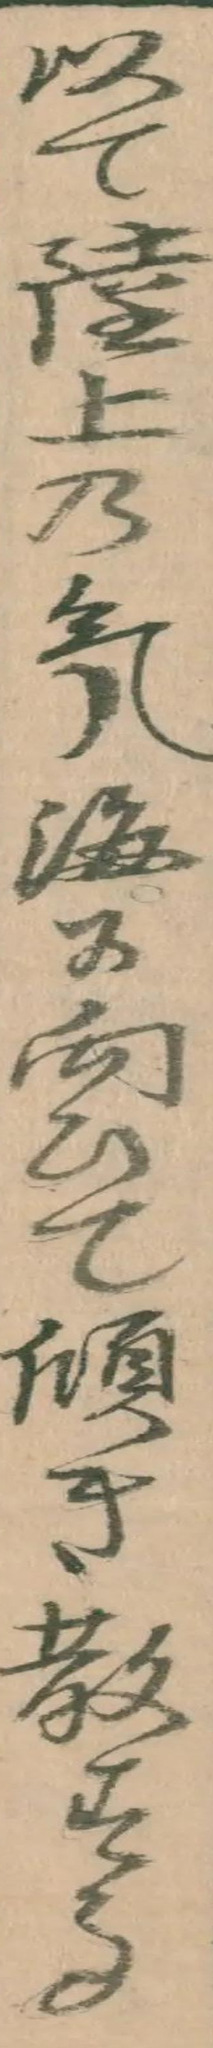以て陸上の気海に向ひて傾き散する
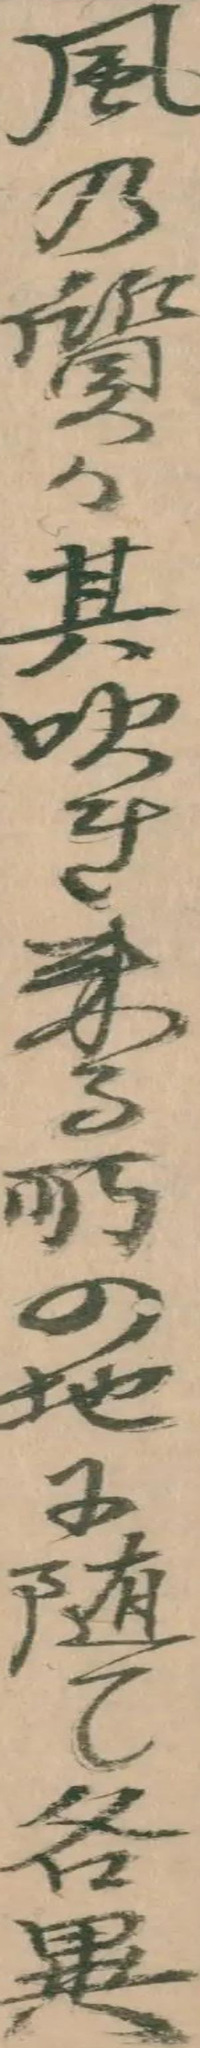風の質の其吹き来る所の地に随て各異
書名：新釈輿地図説
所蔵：国立国会図書館 National Diet Library, JAPAN
